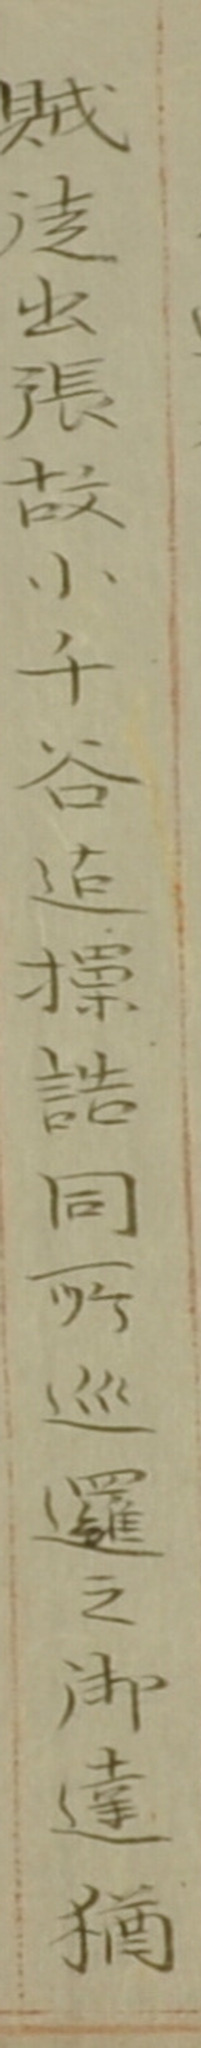賊徒出張故小千谷迄繰詰同所巡邏之御達猶
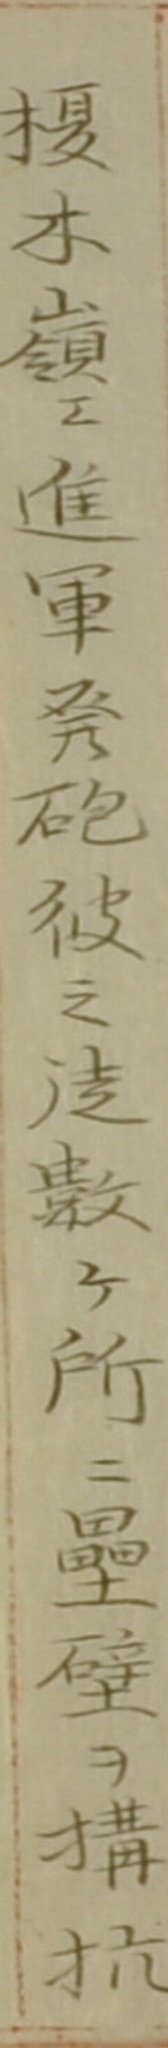榎木嶺エ進軍発砲彼之徒数ヶ所ニ塁壁ヲ搆抗
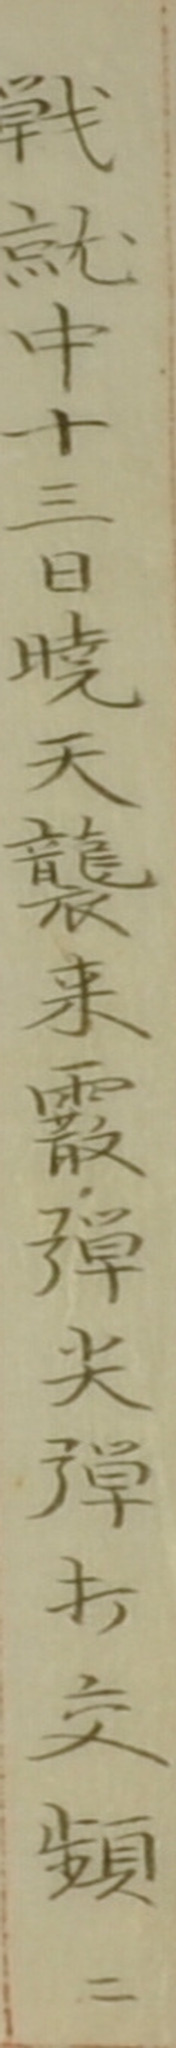戦就中十三日暁天襲来霰弾光弾打交頻ニ
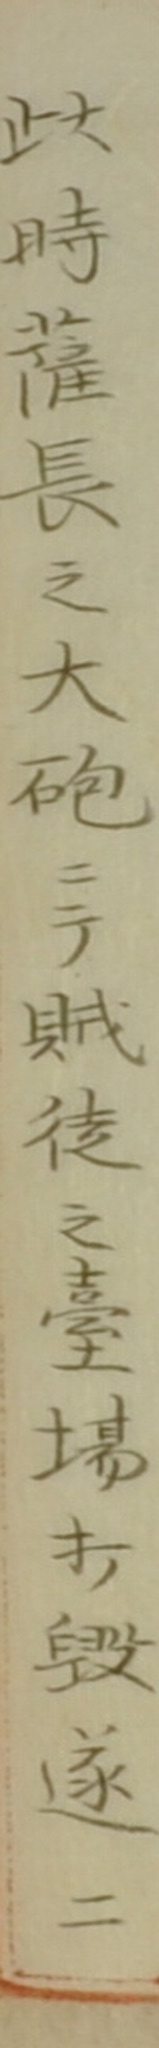此時薩長之大砲ニテ賊徒之台場打毀遂ニ
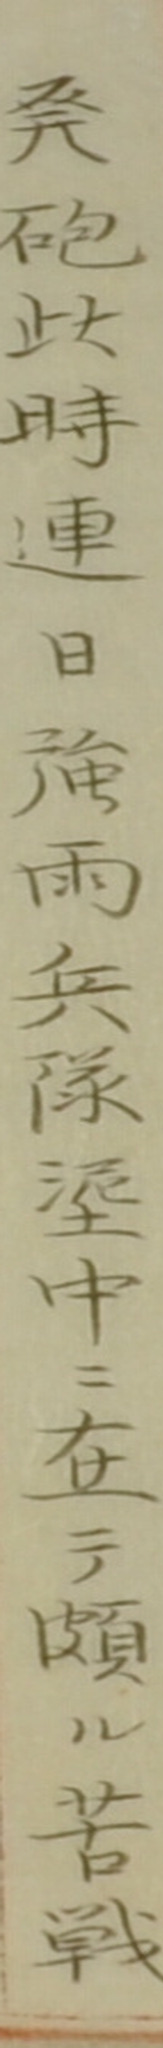発砲此時連日強雨兵隊泥中ニ在テ頗ル苦戦
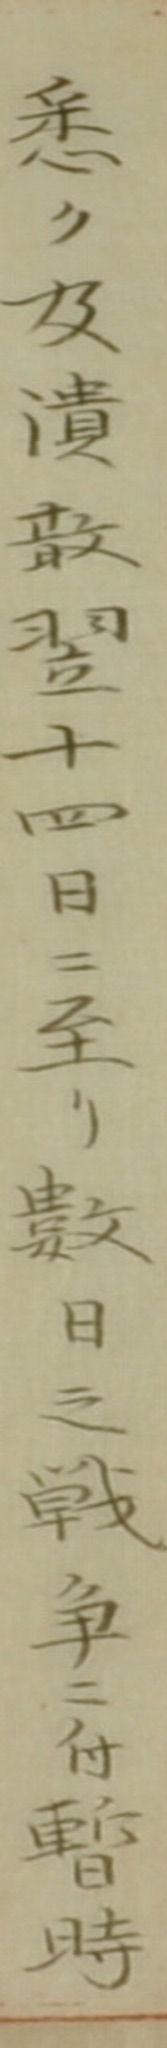悉ク及潰散翌十四日ニ至リ数日之戦争ニ付暫時
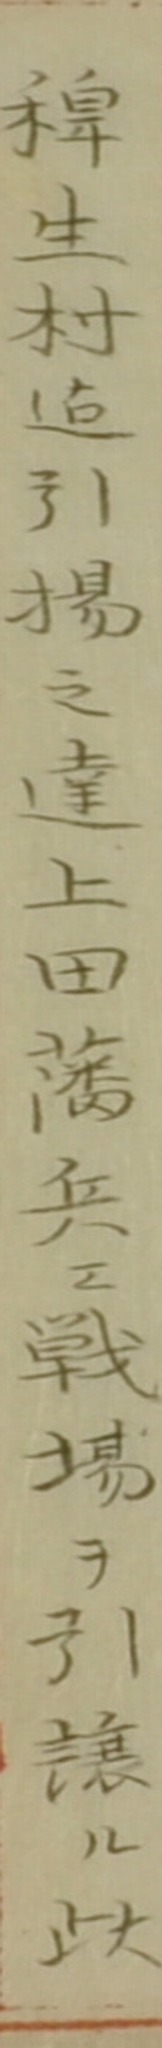稗生村迄引揚之達上田藩兵エ戦場ヲ引譲ル此
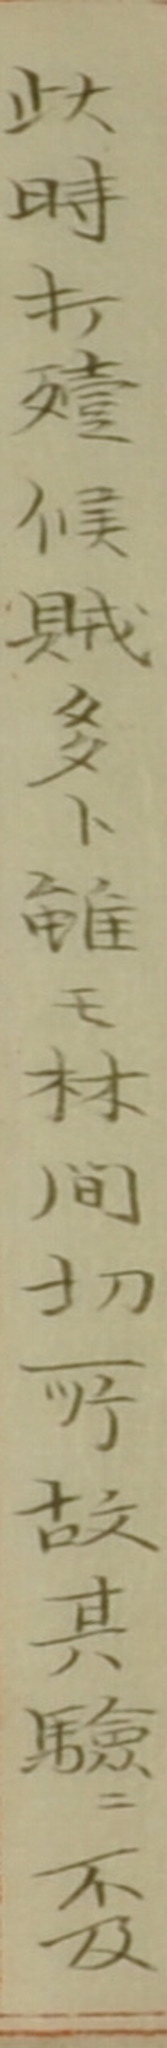此時打殪候賊多ト雖モ林間切所故其験ニ不及
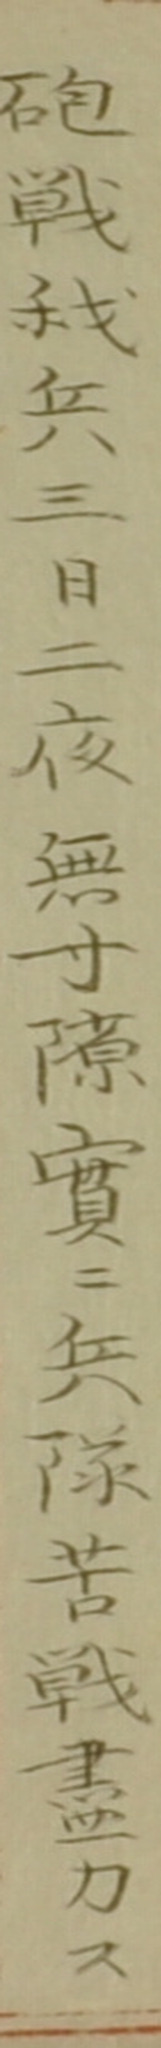砲戦我兵三日二夜無寸隙実ニ兵隊苦戦尽力ス
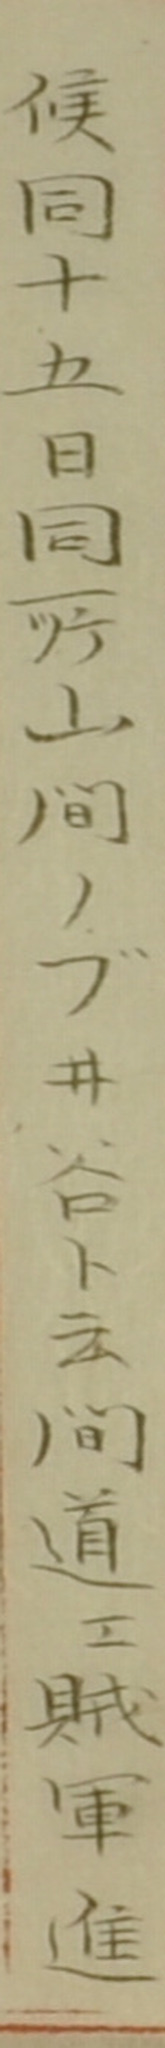候同十五日同所山間ノブ井谷ト云間道エ賊軍進
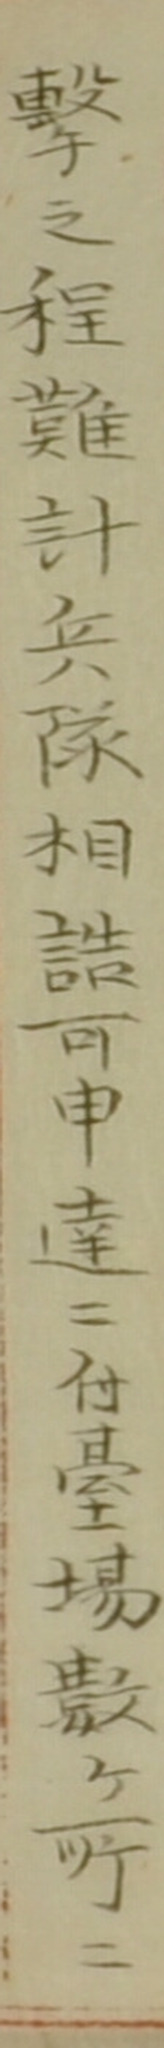撃之程難計兵隊相詰可申達ニ付台場数ヶ所ニ
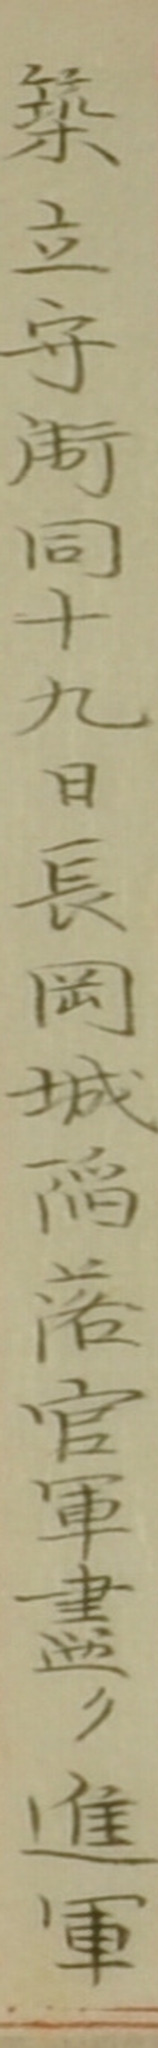築立守衛同十九日長岡城陥落官軍尽ク進軍
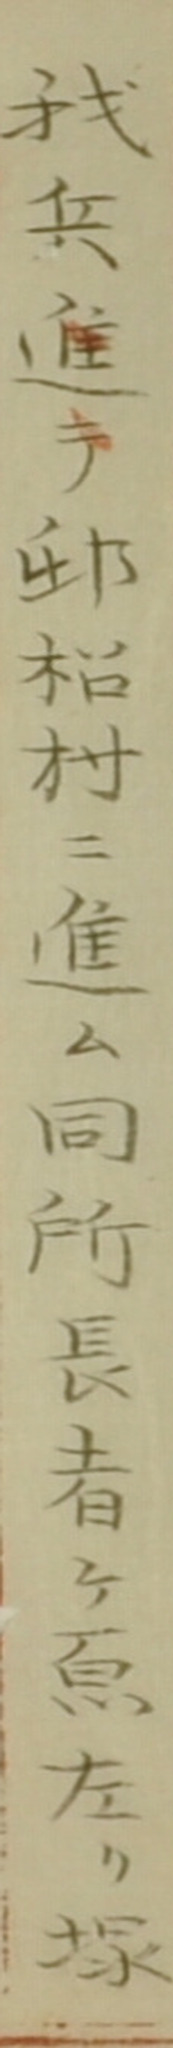】邨松村ニ進ム同所長者ヶ原左リ塚
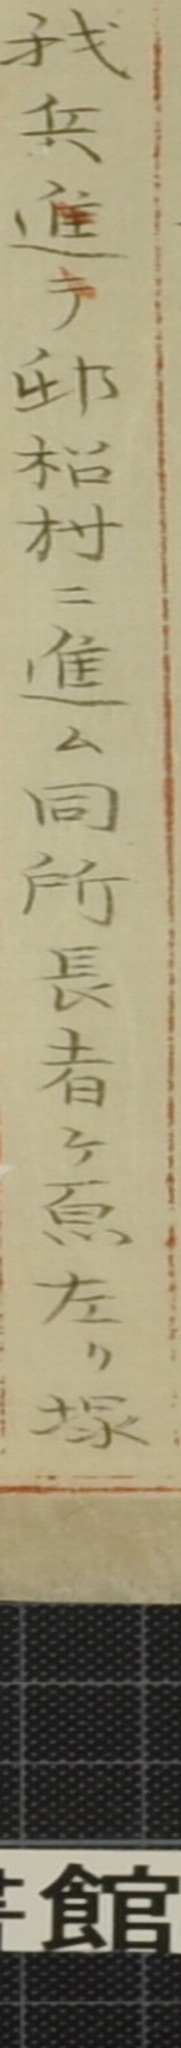】邨松村ニ進ム同所長者ヶ原左リ塚
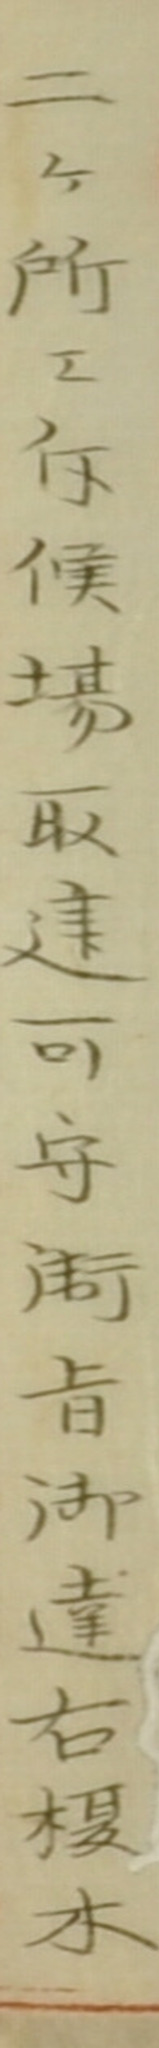二ヶ所エ斥候場取建可守衛旨御達右榎木
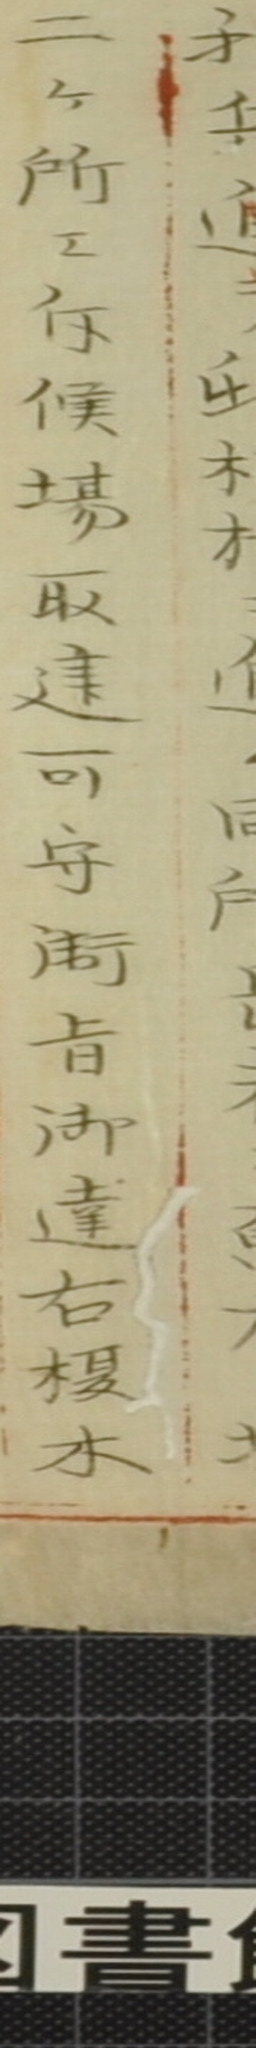二ヶ所エ斥候場取建可守衛旨御達右榎木
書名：奥越出兵中戦争之事件概略抄録（控）
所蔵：伊那市立高遠町図書館・合同会社AMANE
